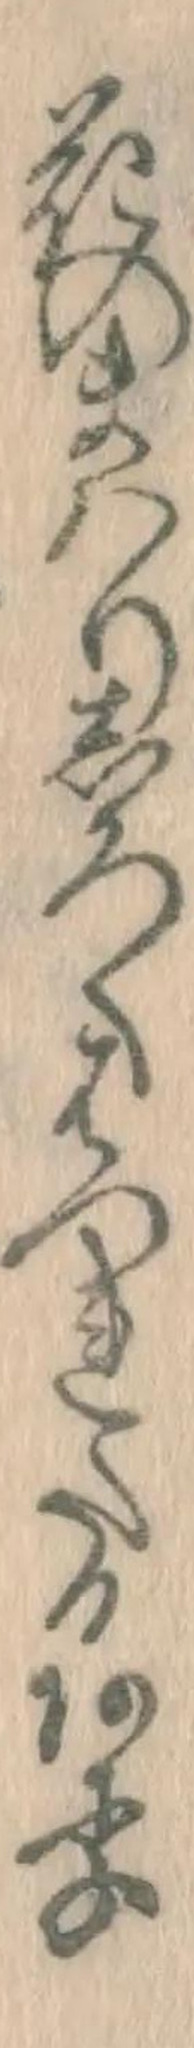花のまはりしろくはつれたるあき
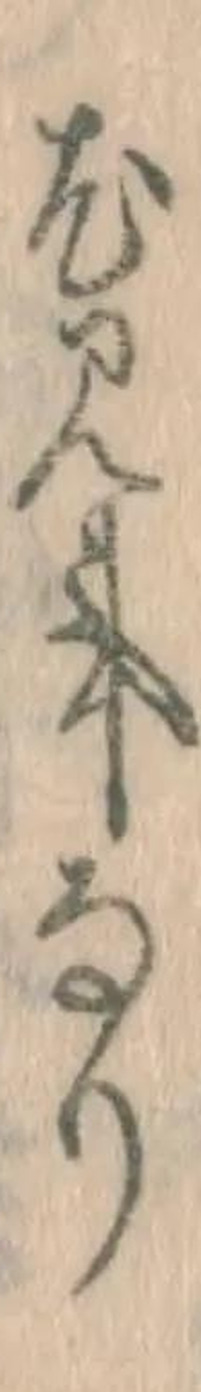尤見事なり
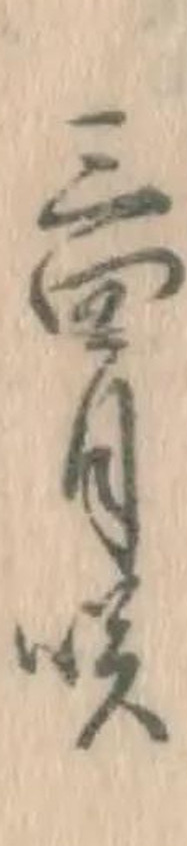三四月咲
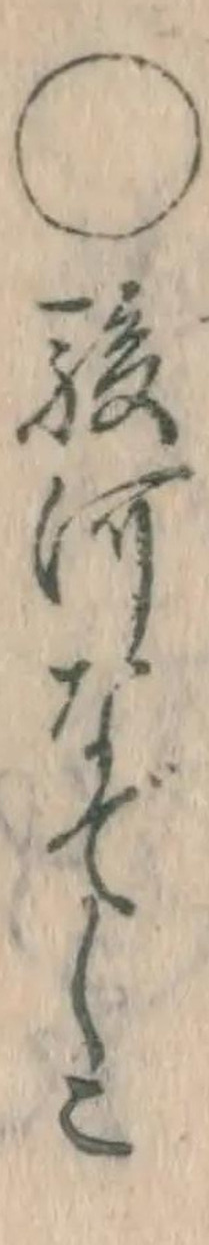〇駿河なでしこ
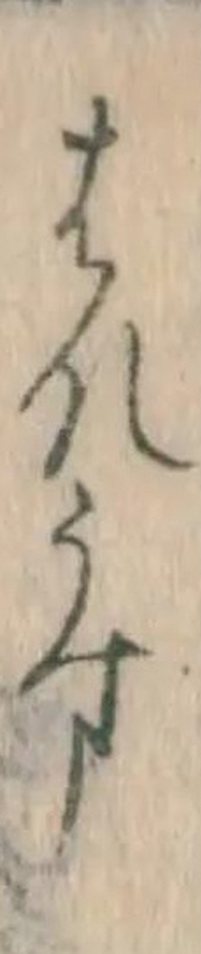はなうす
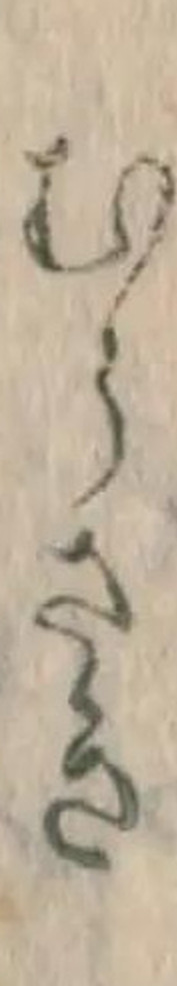むらさき
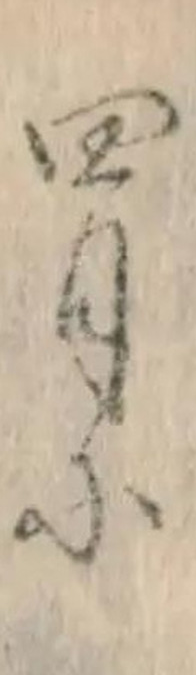四月に

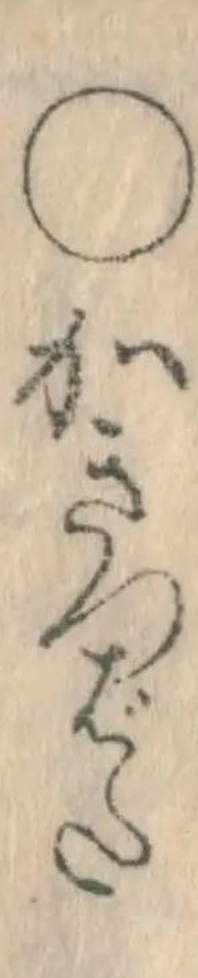〇かきつばた
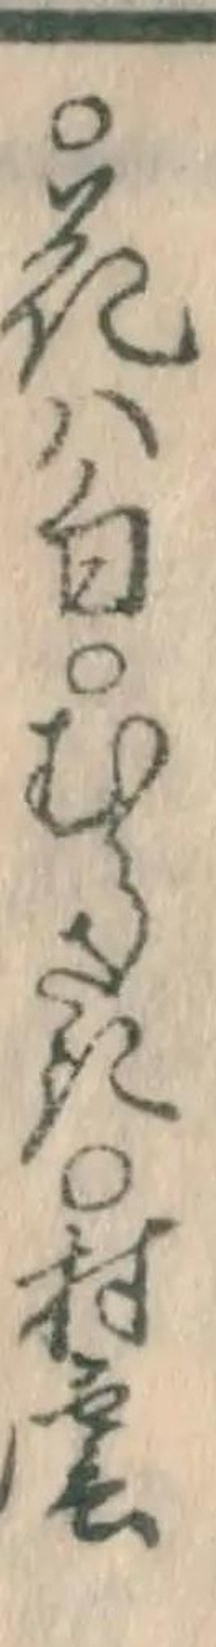〇花は白〇むらさき〇村雲
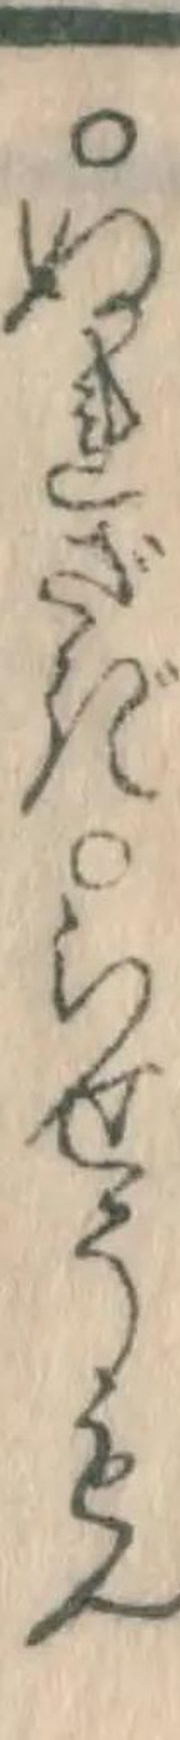〇ぬれざぎ〇らせうもん
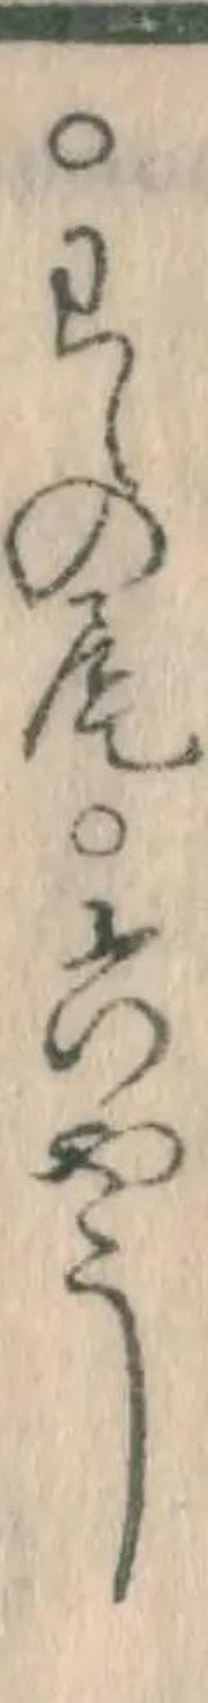〇わしの尾〇六やう
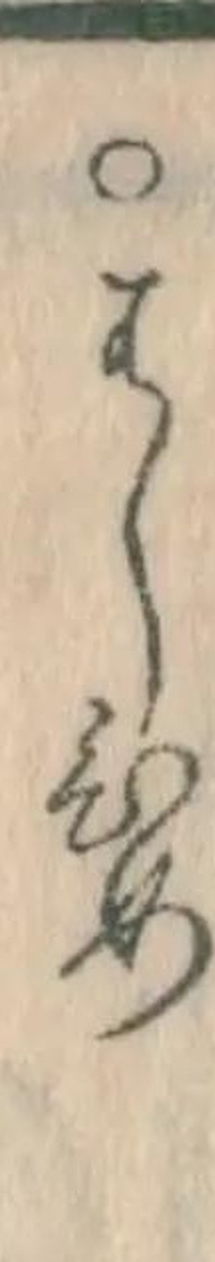〇はしひめ
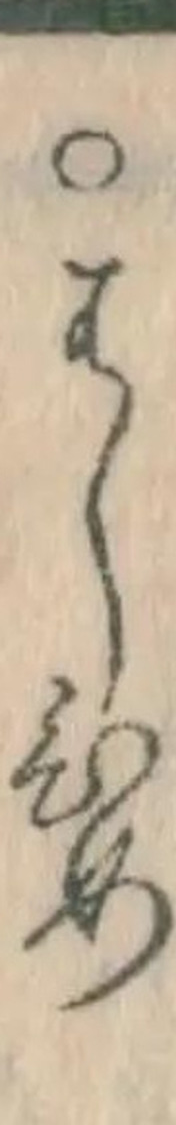〇はしひめ
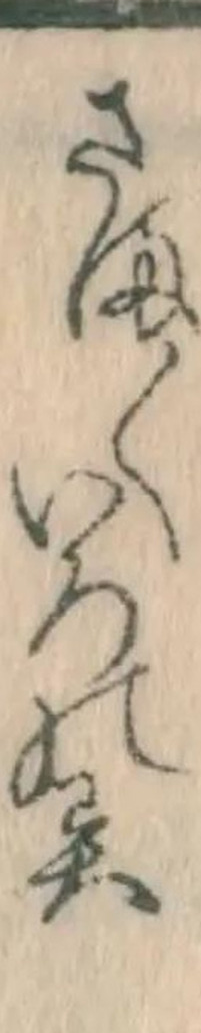さま〳〵いろの異
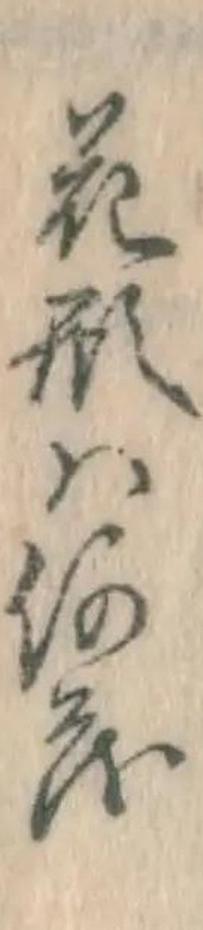花形は何も
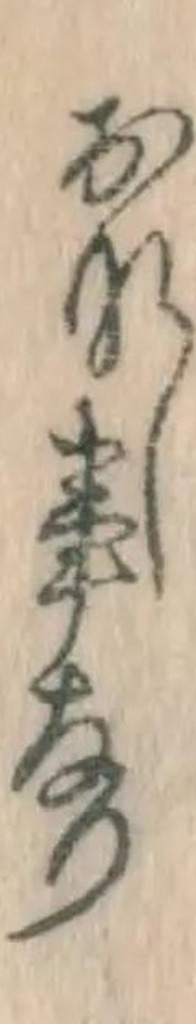おなし事なり
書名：艸花繪前集. [1]
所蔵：国立国会図書館 National Diet Library, JAPAN
